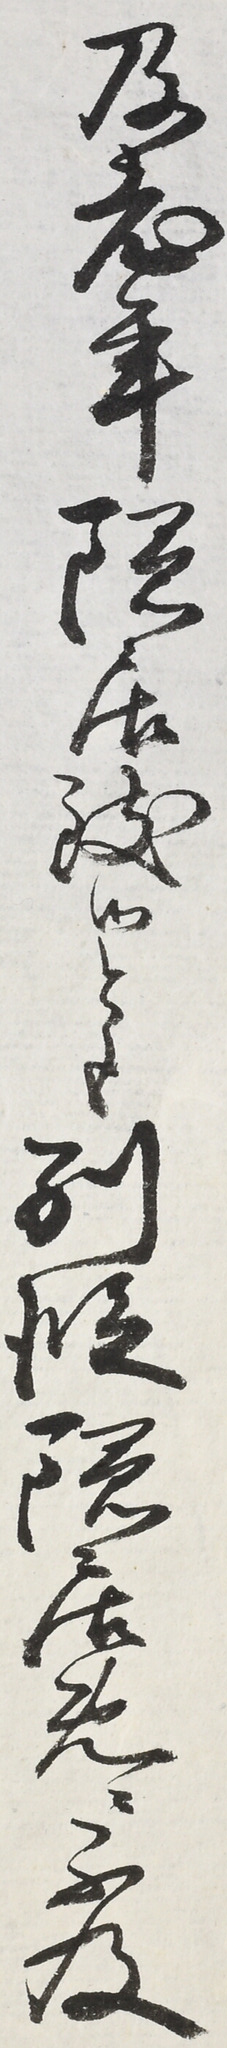及老年隠居致候とも別段隠居免ニ不及
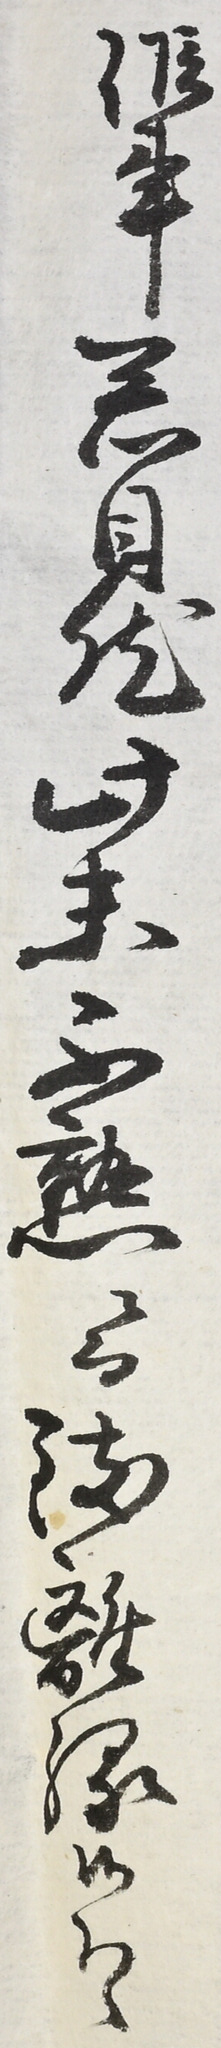候事若自然此末不熟ニ而致離縁候ハゝ

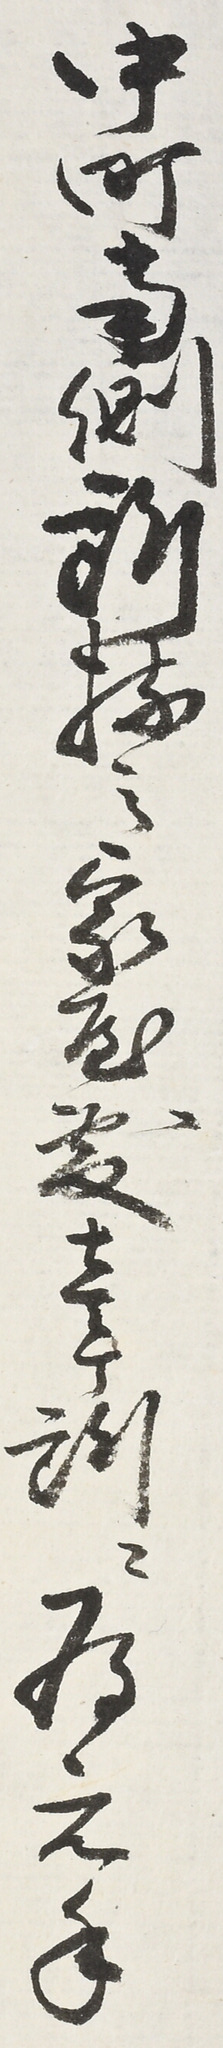中町南側所持之家屋敷処壱ケ所ニ為元手
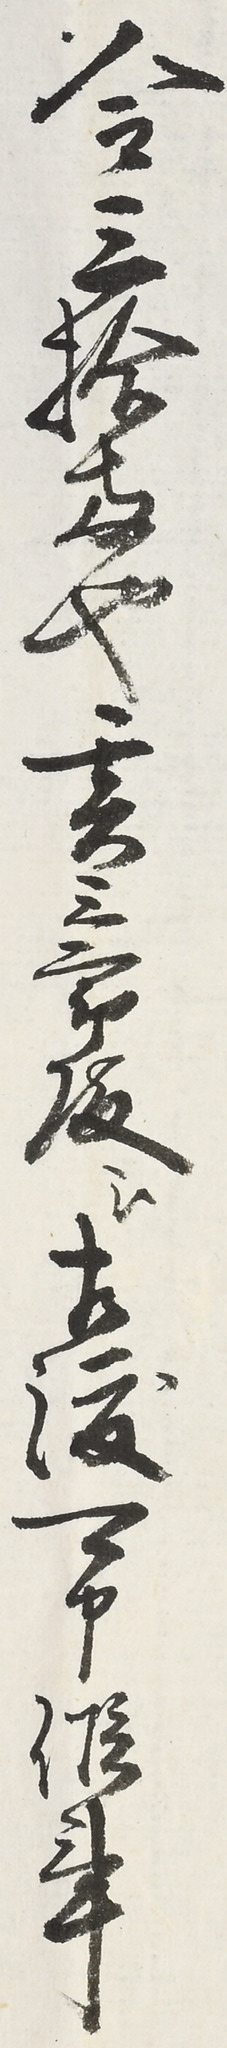金三拾両也亥三郎殿江相渡可申候事
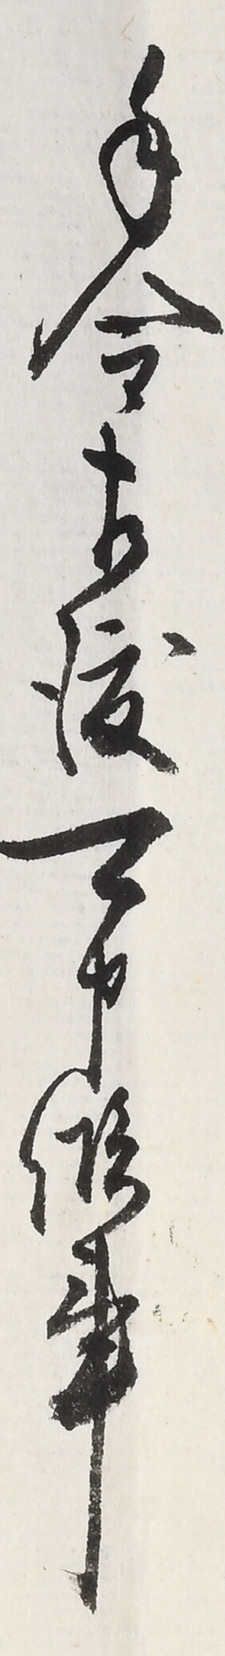手金相渡可申候事
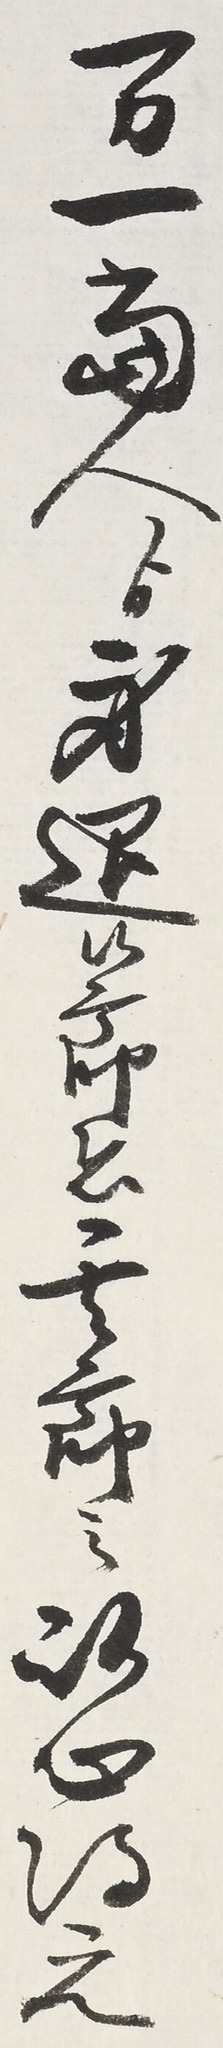万一当人ゟ身退候節者其節之以心得元
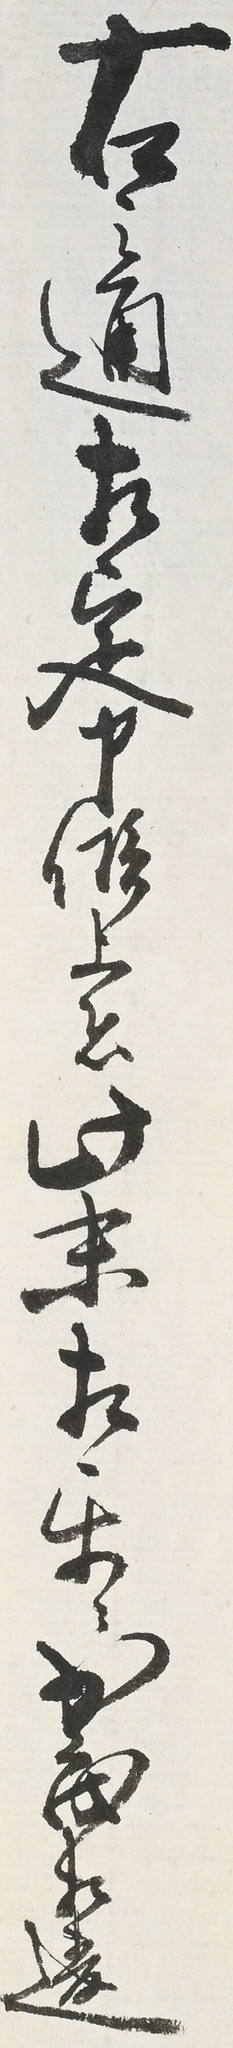右之通相定申候上者此末相互ニ出茂相違
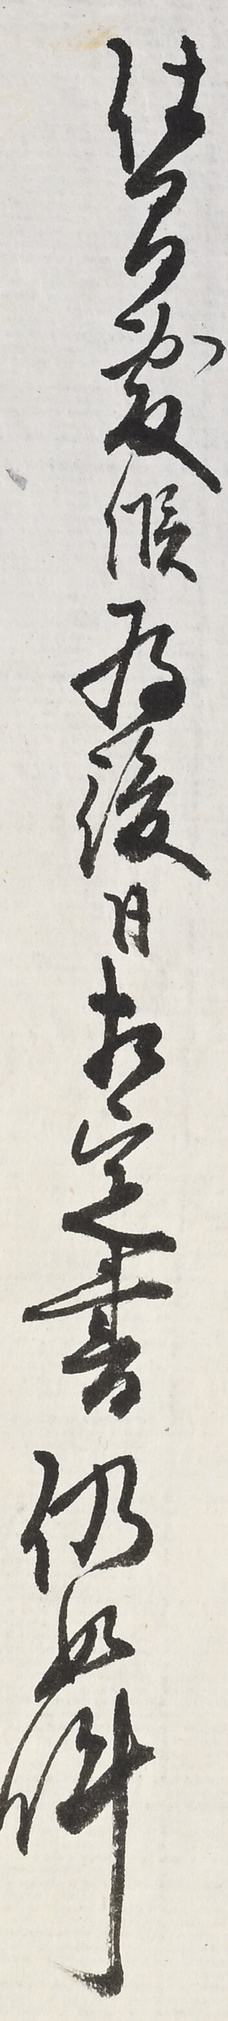仕間鋪候為後日相定書仍如件
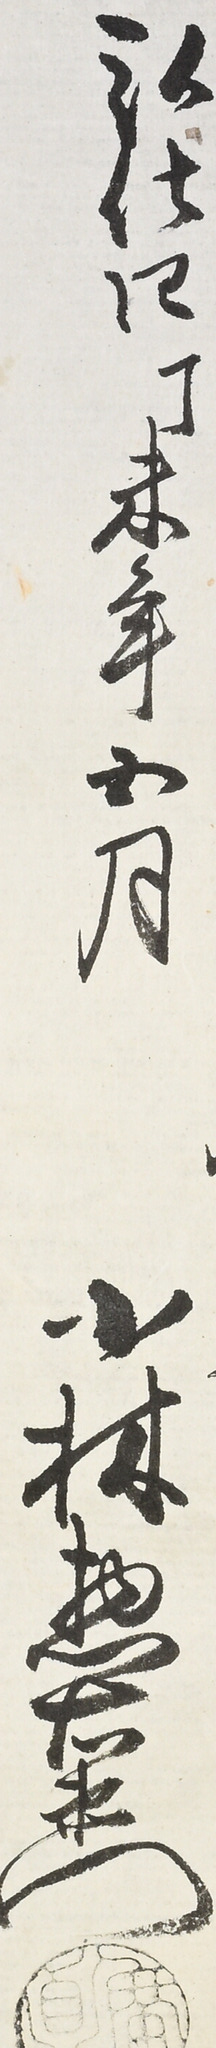弘化四丁未年五月小林惣右衛門㊞
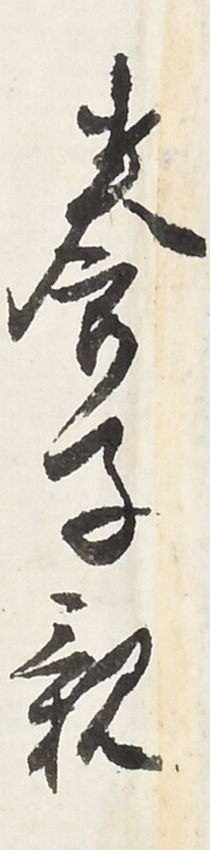養子親
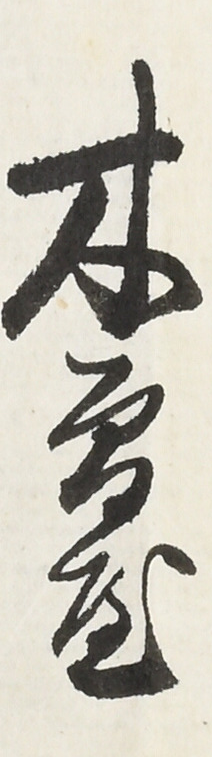木曽屋
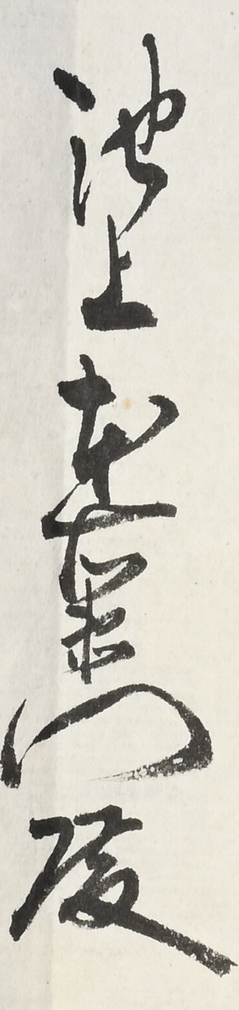池上本右衛門殿
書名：相定申一札之事
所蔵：伊那市立高遠町図書館・合同会社AMANE
